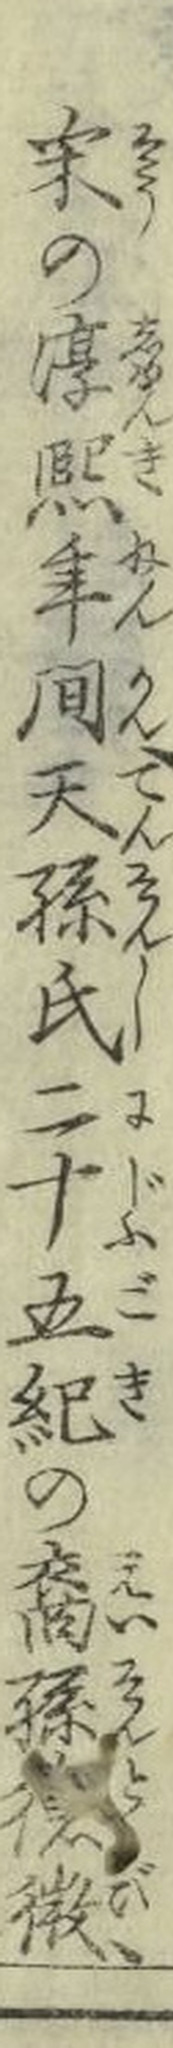宋の淳煕年間、天孫氏廿五紀の裔孫徳微、
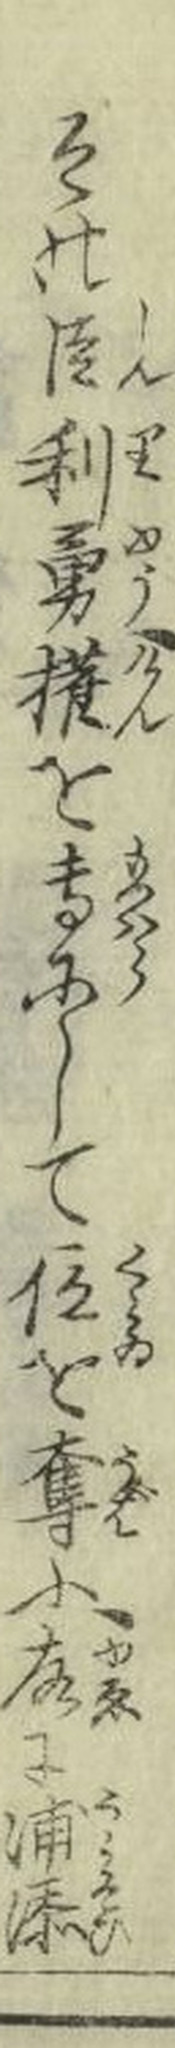その臣利勇、権を専にして位を奪ふ、故に浦添
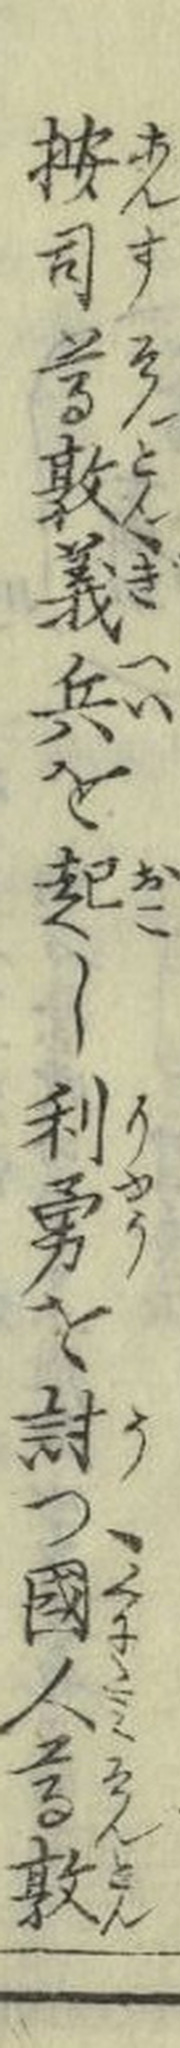按司尊敦、義兵を起し利勇を討つ、国人尊敦
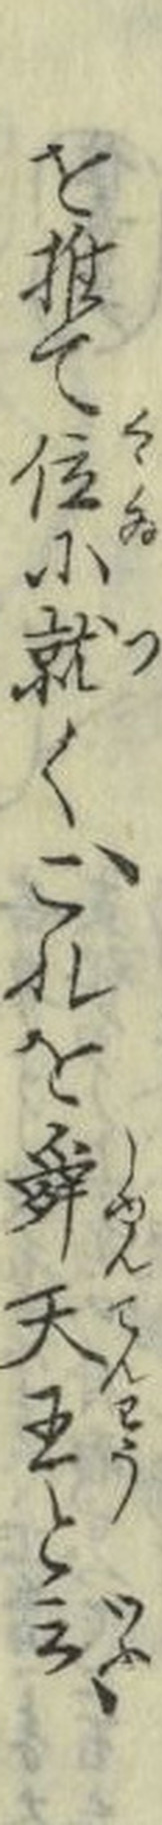を推て位に就く、これを舜天王と云、
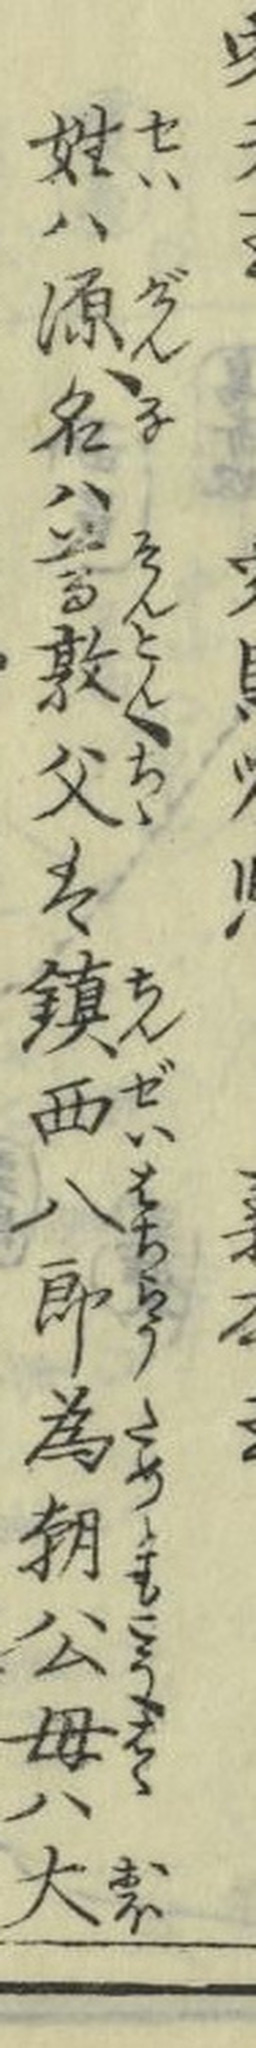姓は源、名は尊敦、父は鎮西八郎為朝公、母は大
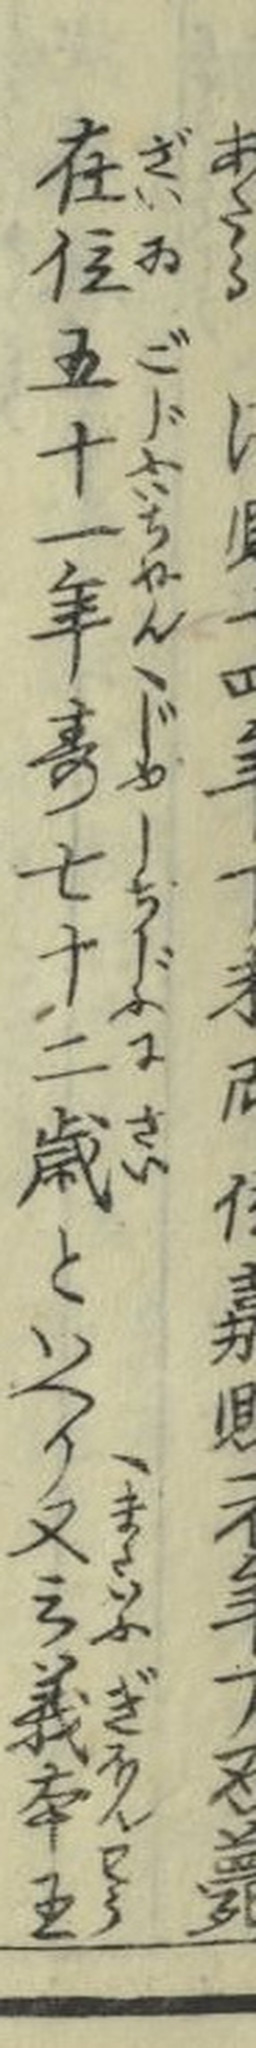在位五十一年、寿七十二歳といへり、又云義本王
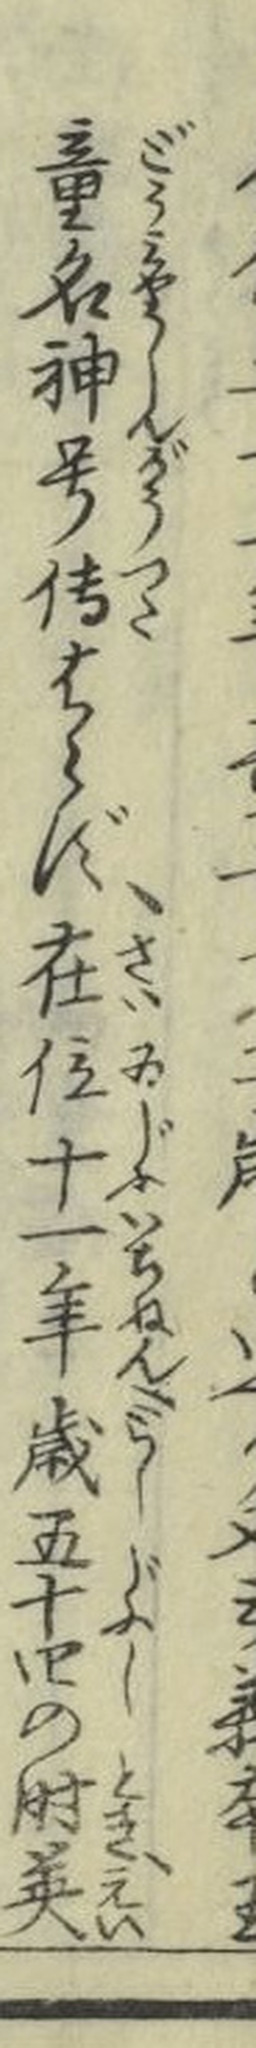童名神号伝はらず、在位十一年、歳五十四の時、英
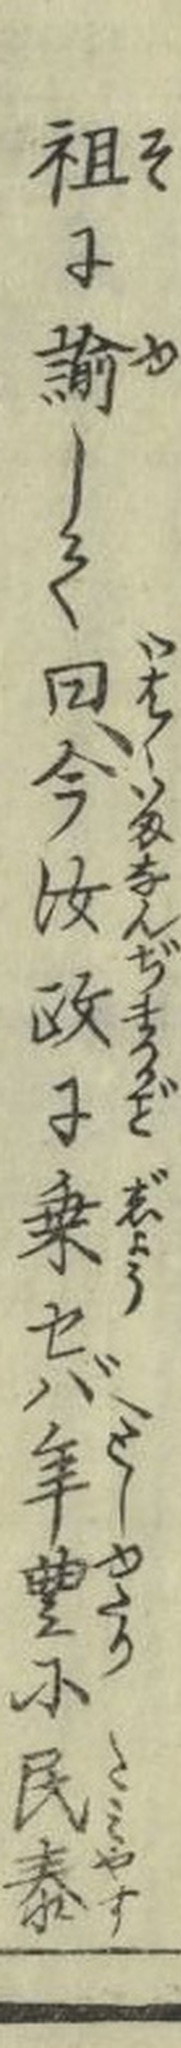祖に諭して曰、今汝政に乗せば、年豊に民泰
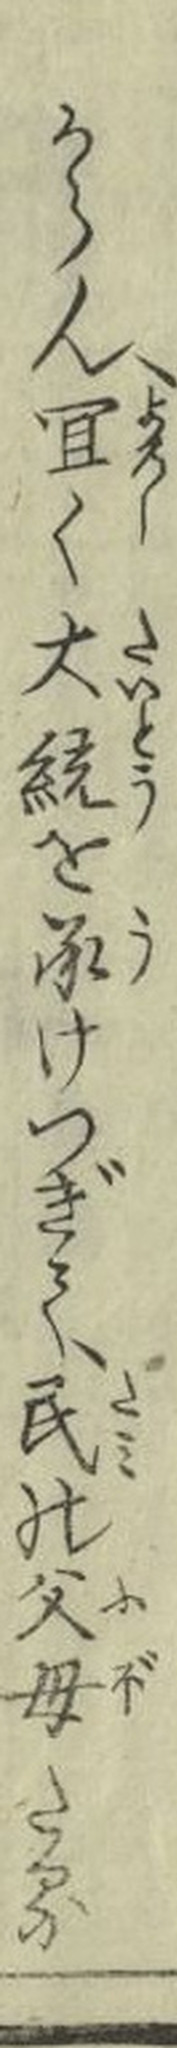からん、宜く大統を承けつぎて、民の父母たる
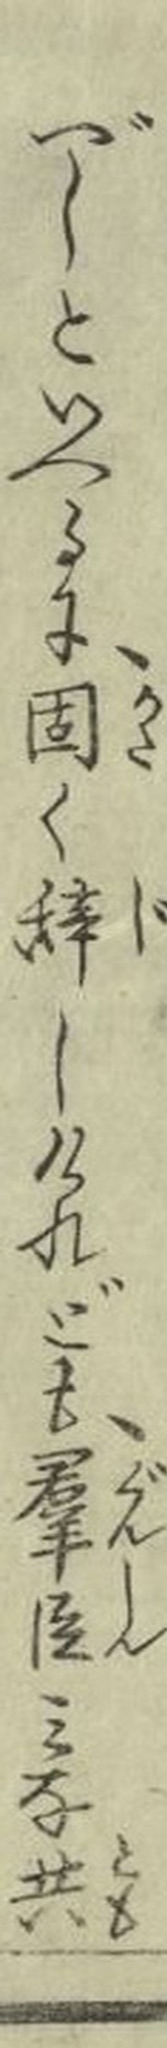べしといへるに、固く辞しけれども、群臣みな共
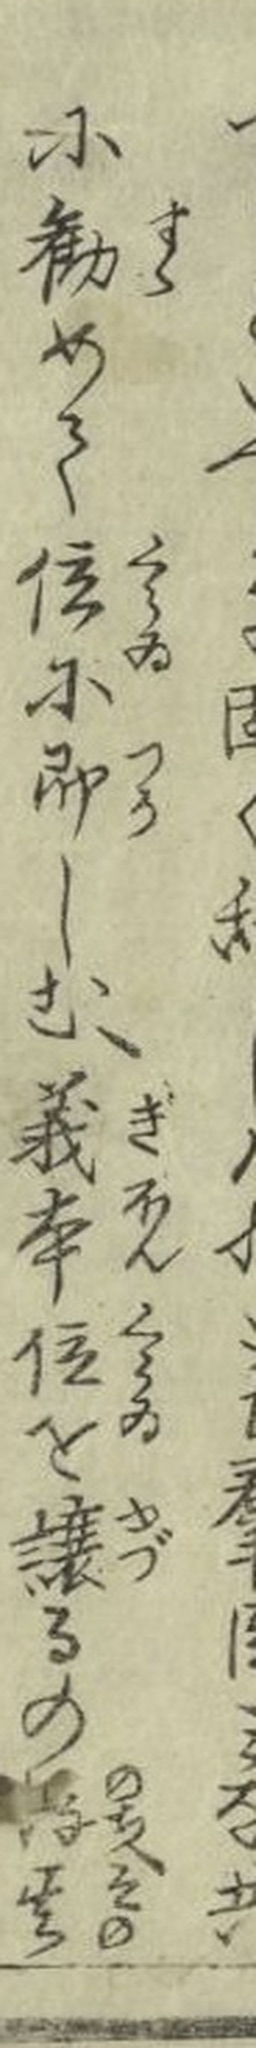に勧めて位に即しむ、義本位を譲るの後、其
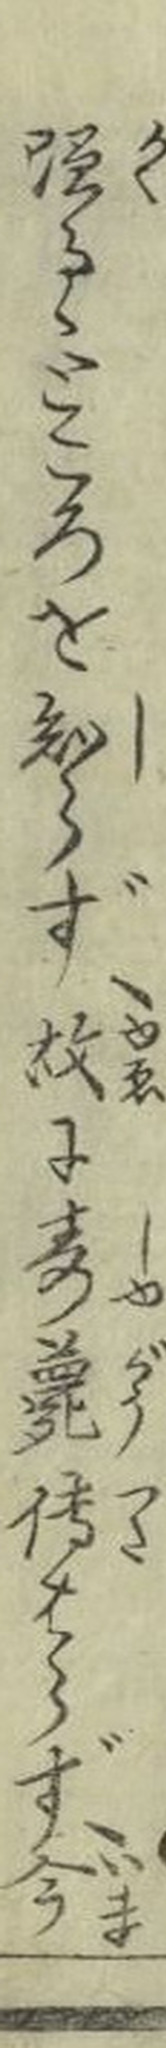隠るゝところを知らず、故に寿薨伝はらず、今

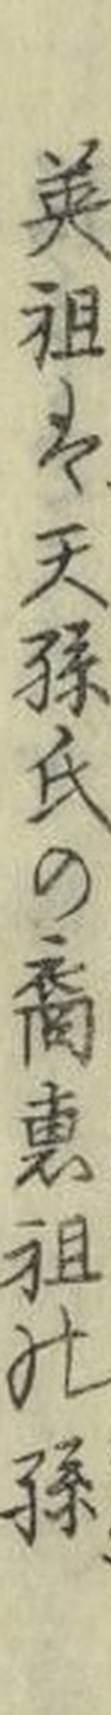英祖は、天孫氏の裔、恵祖の孫、│
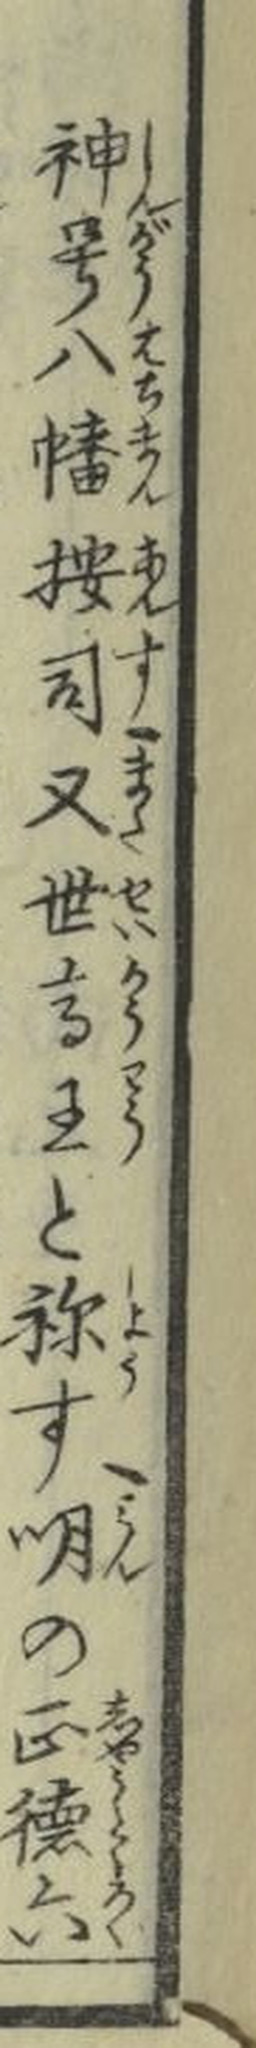神号八幡按司、又世高王と称す、明の正徳六
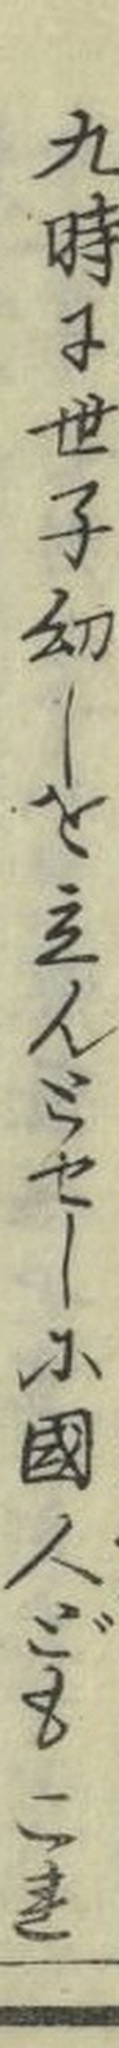九時に、世子幼しを立んとせしに、国人どもこれ
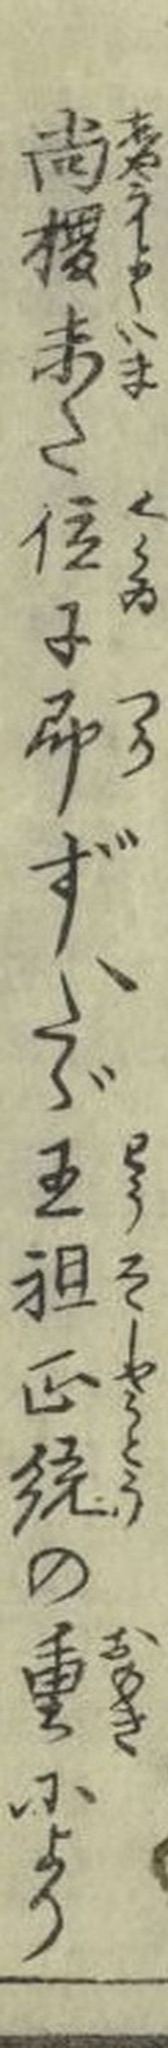尚稷未た位に即ず、たゞ王祖正統の重により
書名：琉球入貢紀略
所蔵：University of the Ryukyus Library
